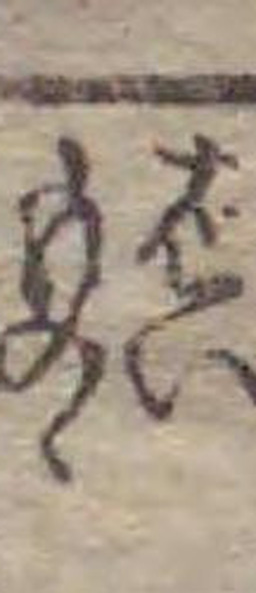ものゝ
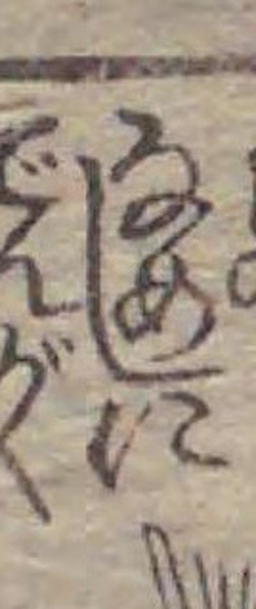でんがく
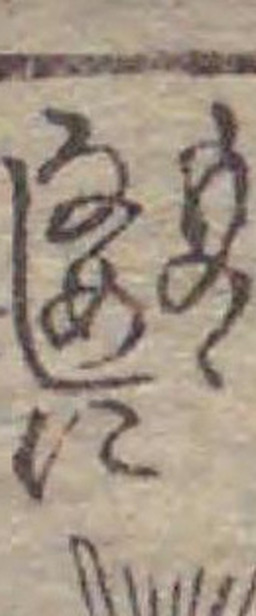なめしに
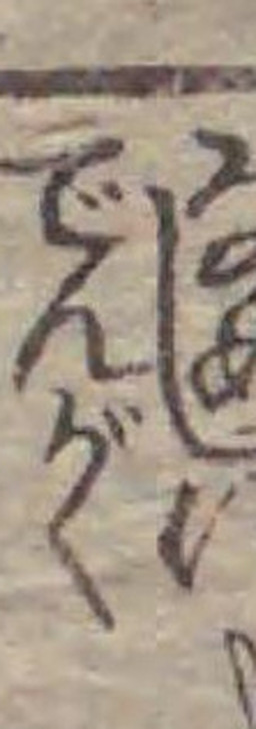でんがく
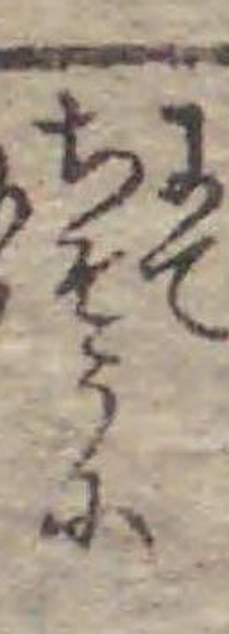ちそうに
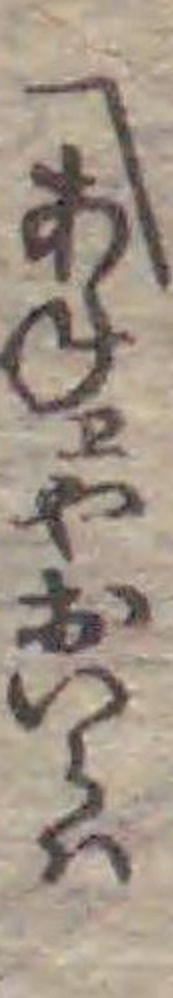〽あねヱやおいらは
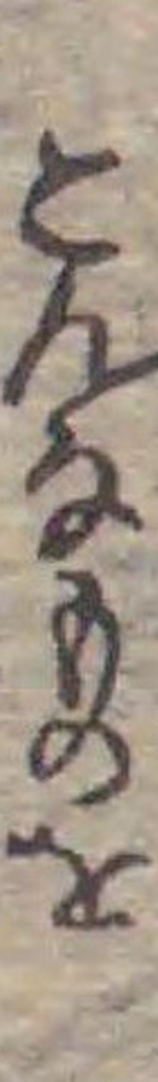こんなものを
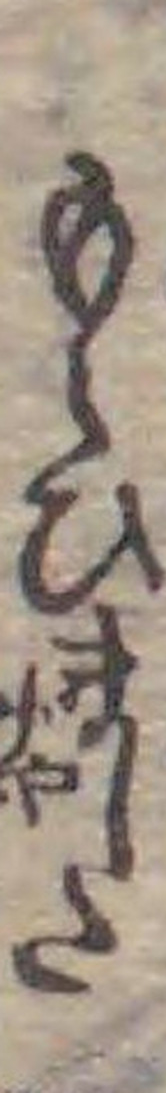もらひました
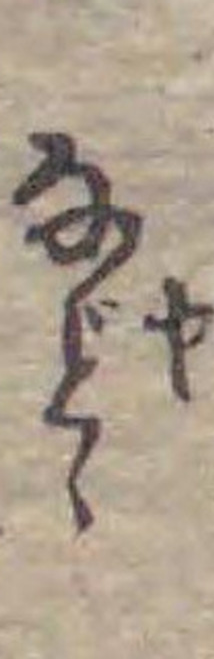などゝ
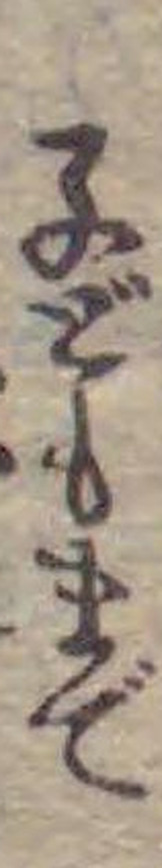子どもまで
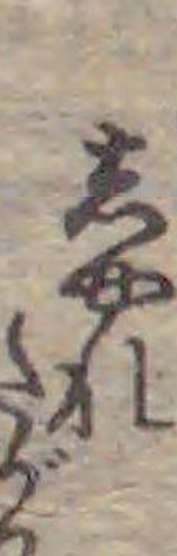しやれ

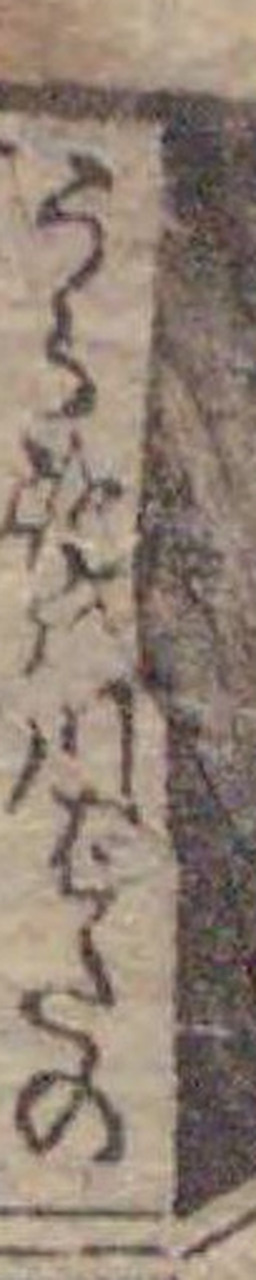うら島は川ばたの
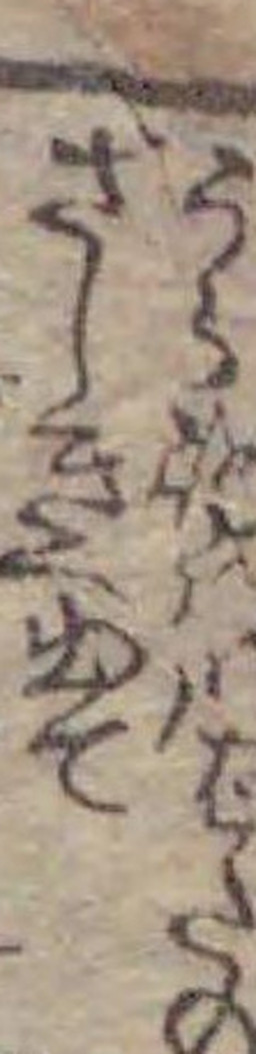ざしきへでゝ
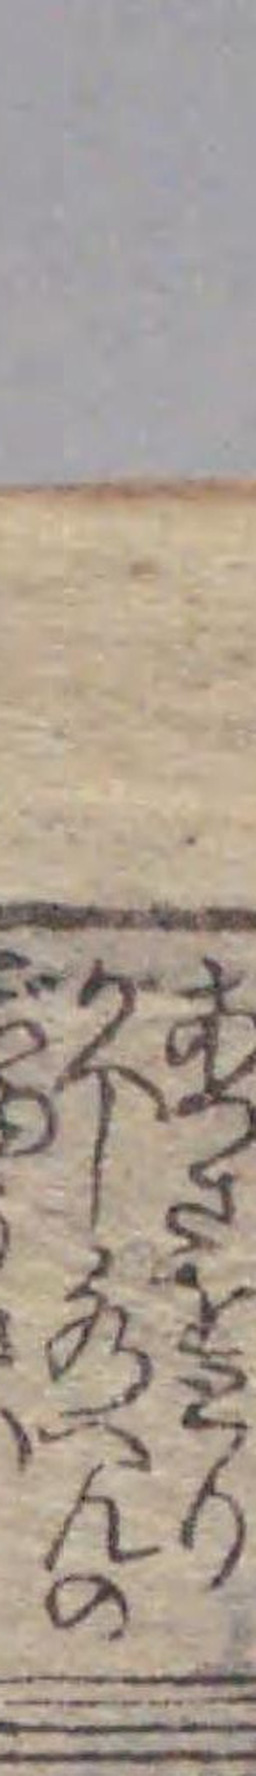かへし水へんの
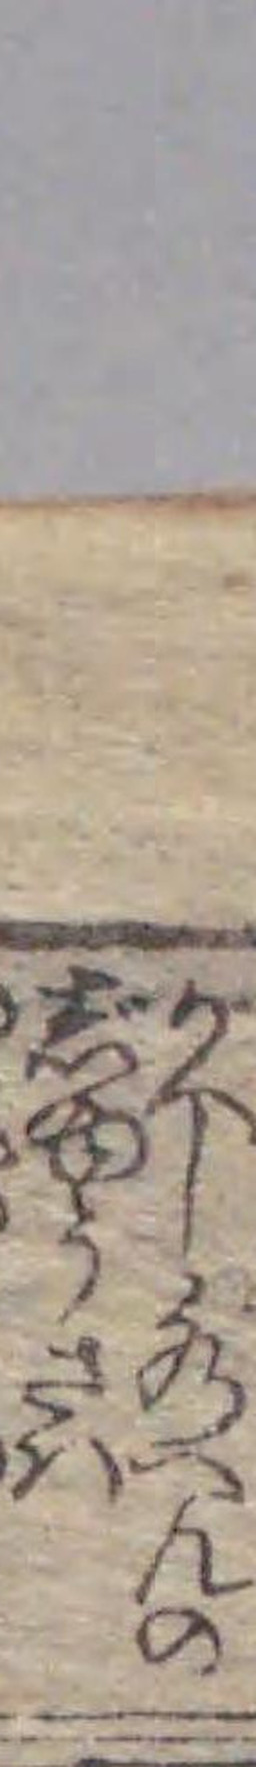じゆうさは
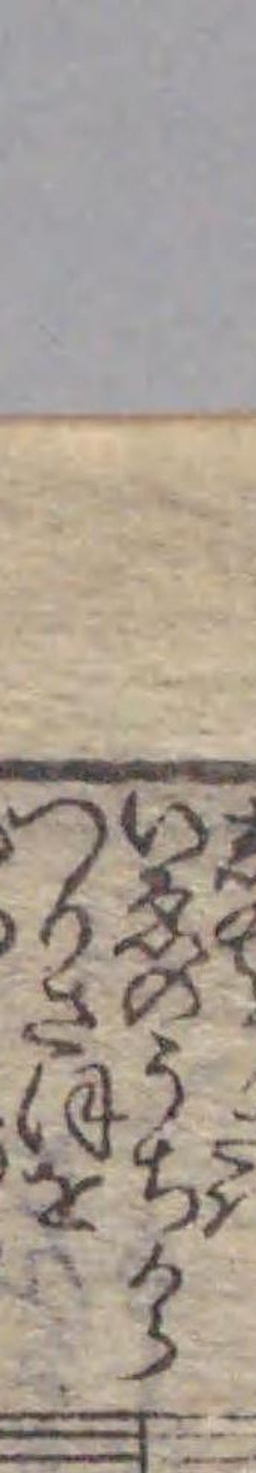いゑのうちから
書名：竜宮苦界玉手箱 : 3巻
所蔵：国立国会図書館 National Diet Library, JAPAN
